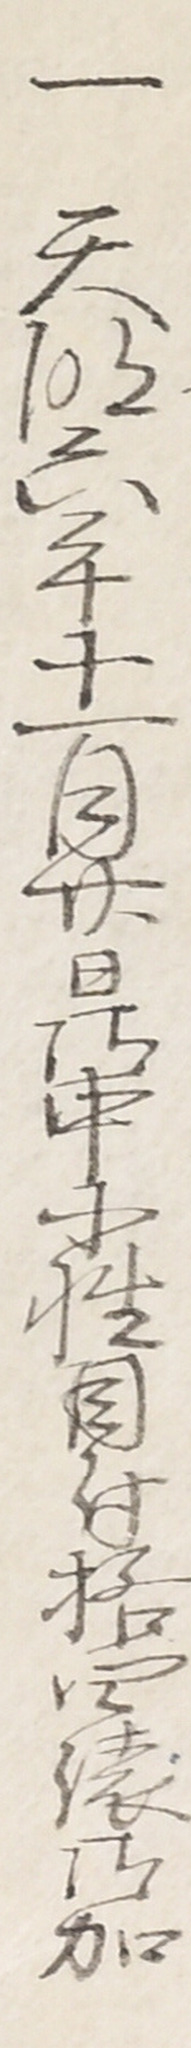一天明六午十一月廿日御中小性目付格四拾俵御加
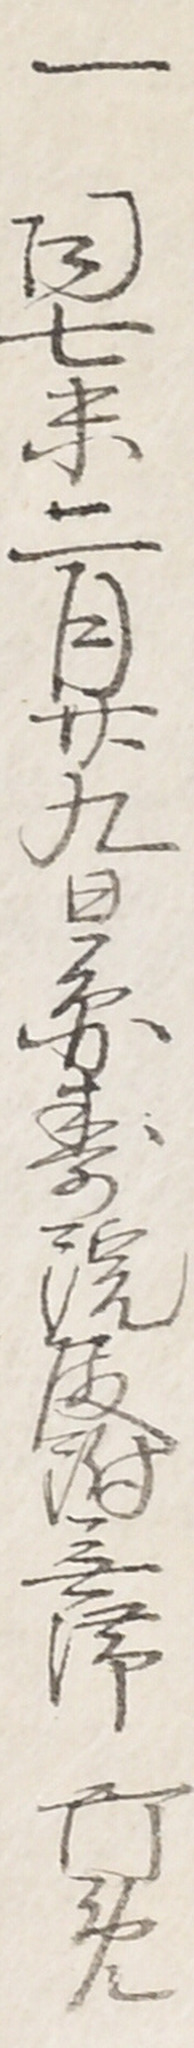一同七未二月廿九日円寿院殿附無滞御免
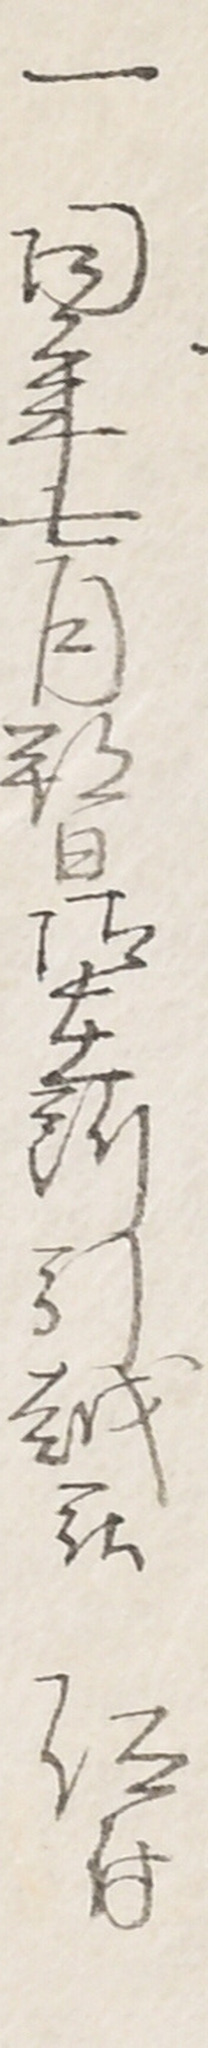一同年七月朔日御在所引越被仰付
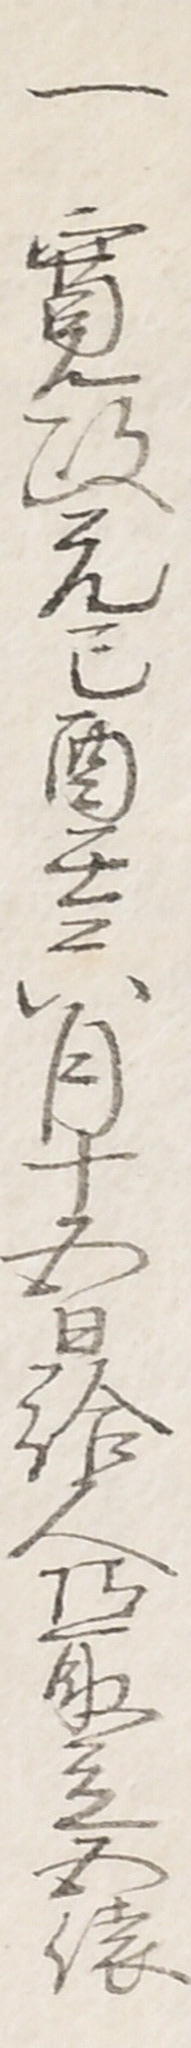一寛政元己酉閏六月十五日給人御取立五俵
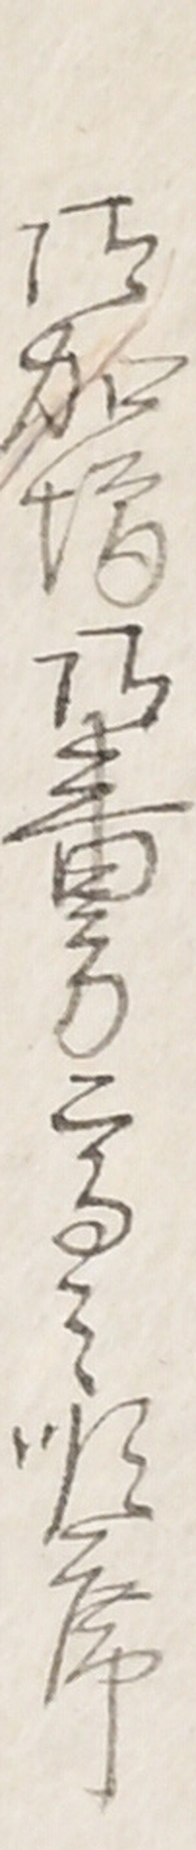御加増御番方高之順席
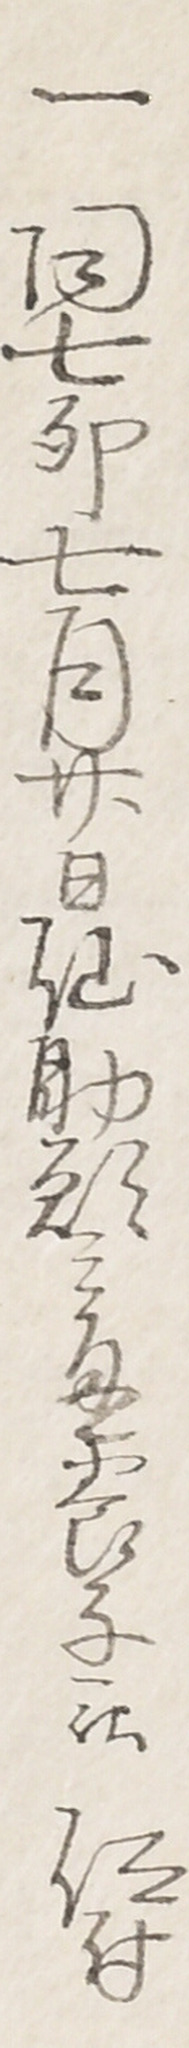一同七卯七月廿日仙助願之通養子被仰付
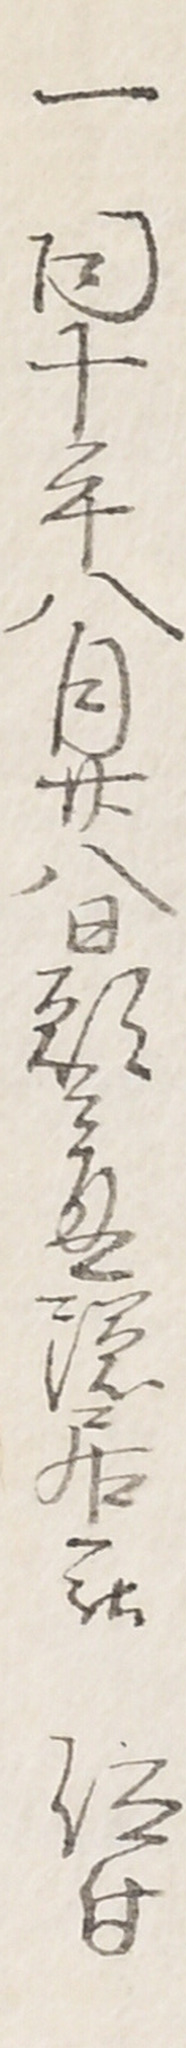一同十午八月廿八日願之通隠居被仰付
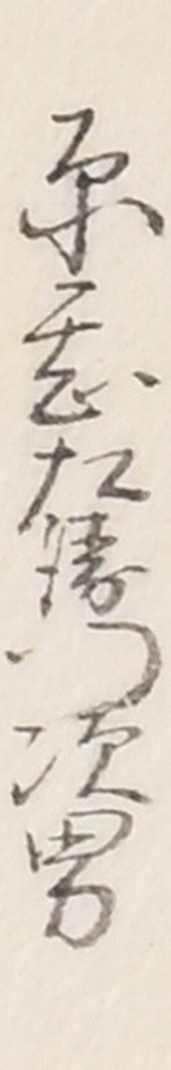原甚左衛門次男
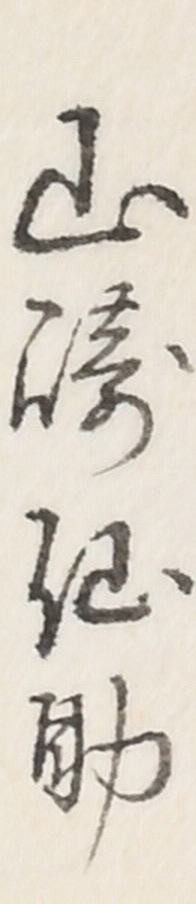山崎仙助
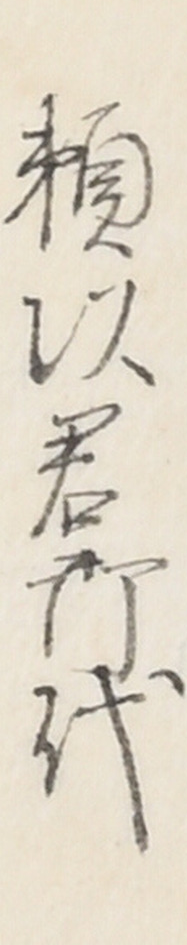頼以君御代
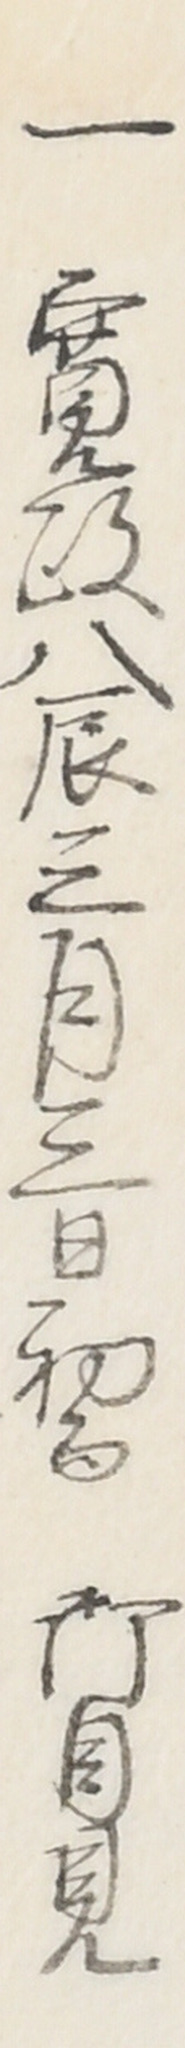一寛政八辰三月三日初而御目見
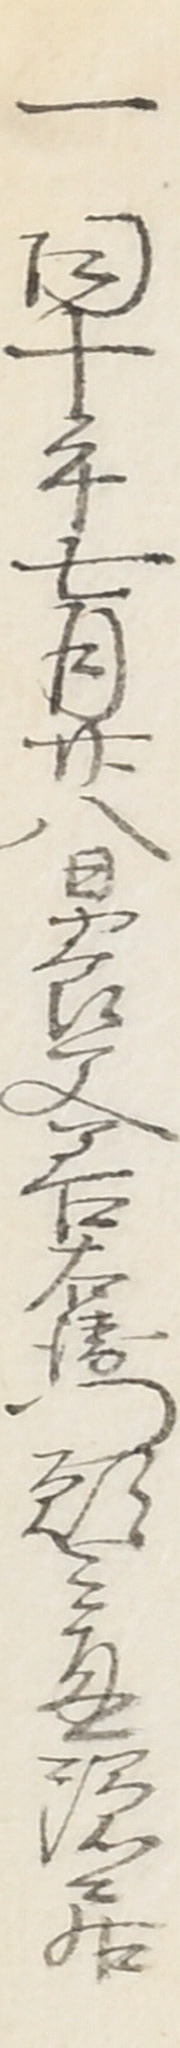一同十午七月廿八日養父善右衛門願之通隠居
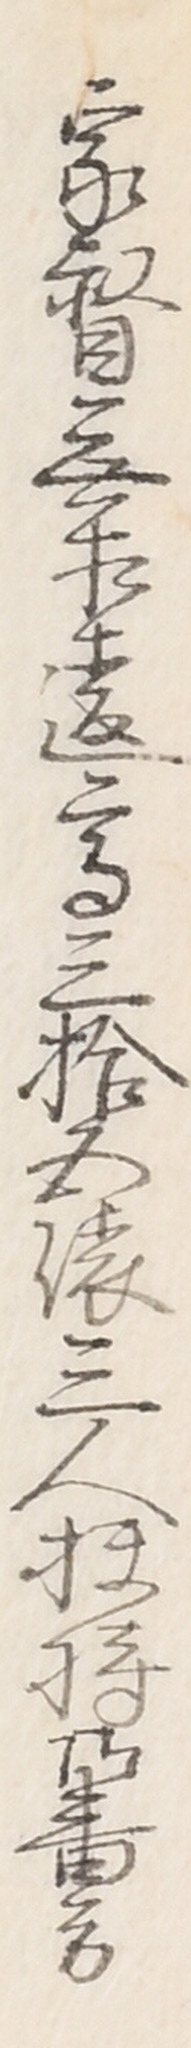家督無相違高三拾五俵三人扶持御番方
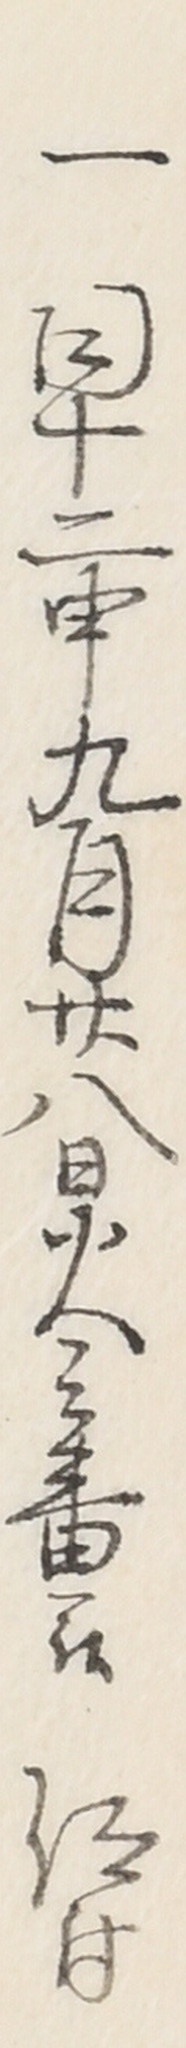一同十二申九月廿八日被之番被仰付
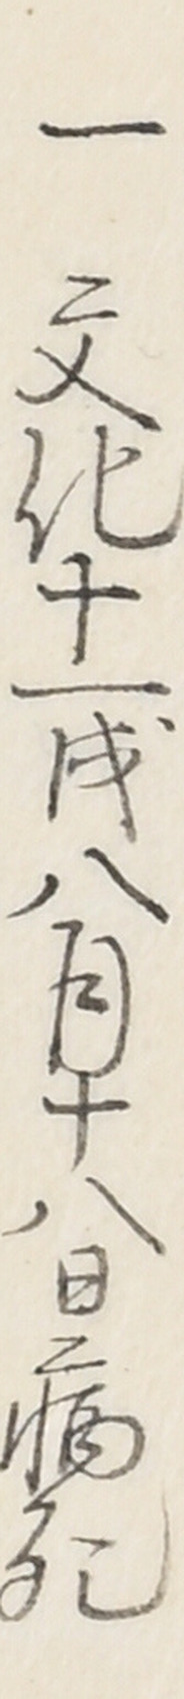一文化十一戌八月十八日病死
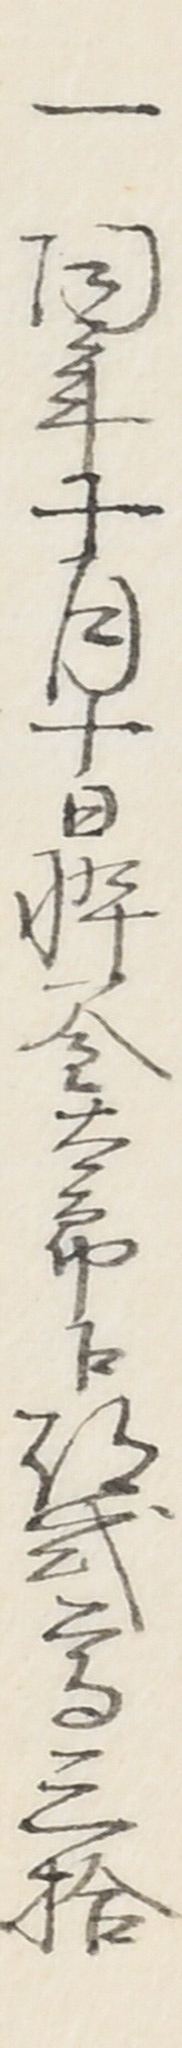一同年十月十日伜釜太郎江跡式高三拾
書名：給人諸士勤仕録（七）
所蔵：伊那市立高遠町図書館・合同会社AMANE
